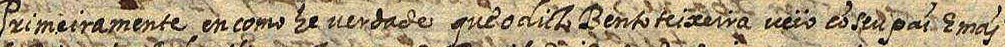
Primeiramente en como he uerdade que o dicto Bento teixeira ueio cō seu paī E maȷ̃
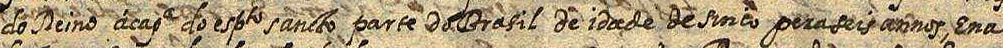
do Reino á capa do espto sancto parte do Brasil de idade de sinco pera seis annos, E na
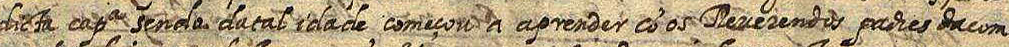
dicta capa sendo da tal idade começou a aprender cō os Reuerendos padres da com
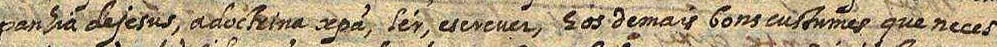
panhia de jesus, a doctrina xpā, lér, escreuer, E os demais bons custumes que neces
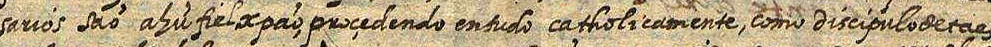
sarios saõ a hū fiel xpaõ, proçedendo en tudo catholicamente, como discipulo de taes
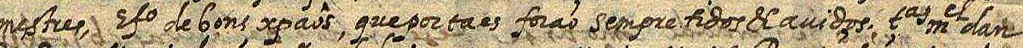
mestres, E fo de bons xpaõs, que por taes foraõ sempre tidos & auidos, tas mel dan
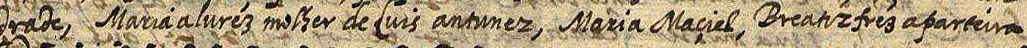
drade, Maria alurez̄ molher de Luis antunez, Maria Maçiel, Breatiz frez̄ a parteira
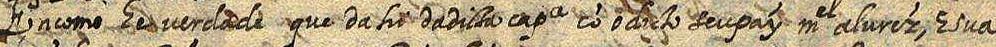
En como he uerdade que dahi da dicta capa cō o dicto seu paȳ mel alurez̄, E sua
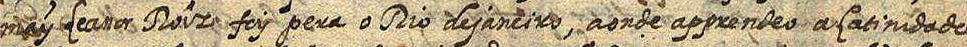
maỹ Leanor Roīz foy pera o Rio de janeiro, aonde apprendeo a Latinidade
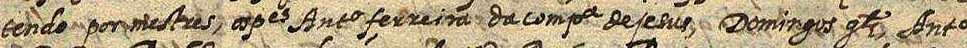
tendo por mestres, os pes Anto ferreira da compa de jesus, Domingos gl̄z, Anto
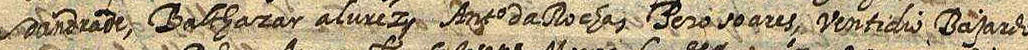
dandrade, Balthazar alurez̄, Anto da Rocha, Pero soares, Ventidio Bajardo
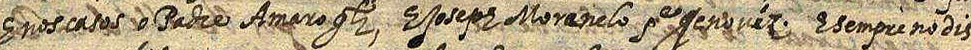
E nos casos o Padre Amaro gl̄z, E Joseph Moranelo pe genovez. E sempre no dis
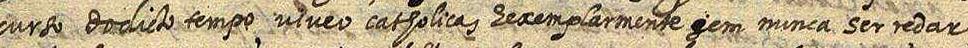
curso do dicto tempo uiueo catholica, E exemplarmente sem nunca ser redar
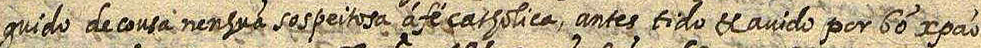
guido de cousa nenhuā sospeitosa á fé catholica, antes tido & auido por bō xpaõ
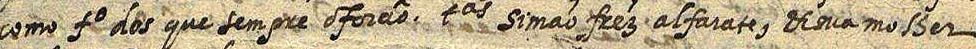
como fo dos que sempre o foraõ. tas Simaõ frez̄ alfaiate, & sua molher
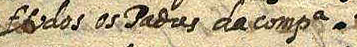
E todos os Padres da compa.
